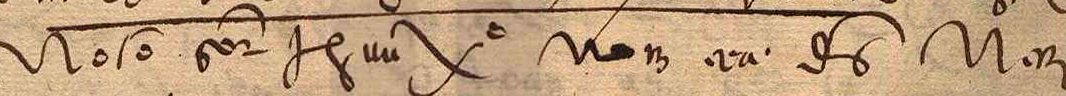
Noso sōr Jhuu Xo nom era ds̄ nem
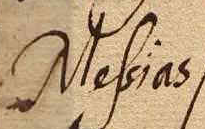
Messias
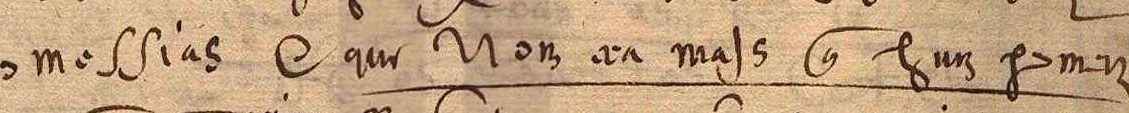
o messias e que nom era maJs q̄ hum homem
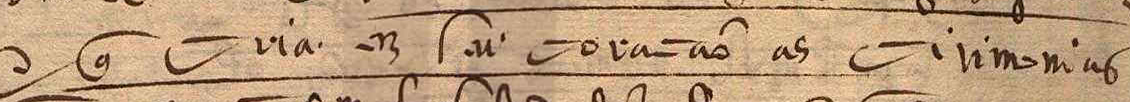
e q̄ cria em seu coração as cirimonias
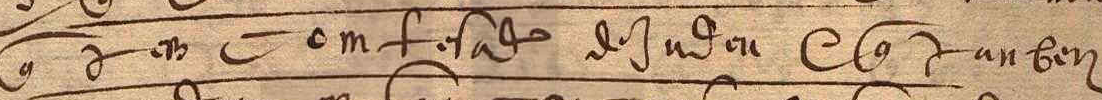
q̄ tem Comfesado de Judeu e q̄ tanbem
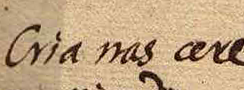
Cria nas cere
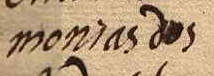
monias dos
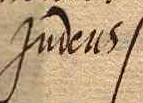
Judeus /
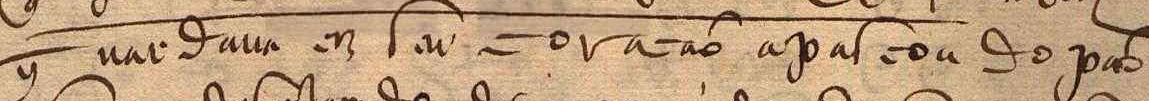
guardaua em seu coração a pascoa do paõ
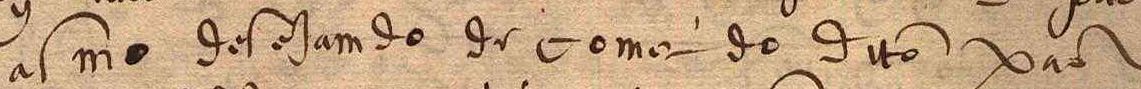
asmo deseJamdo de comer do ditō paõ
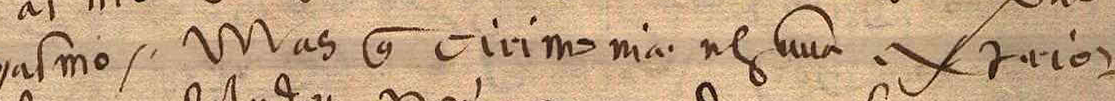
asmo /. Mas q̄ cirimonia nhūua exterior
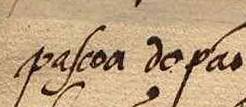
pascoa do pão
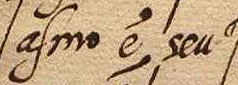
asmo ē seu
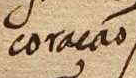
coraçaõ
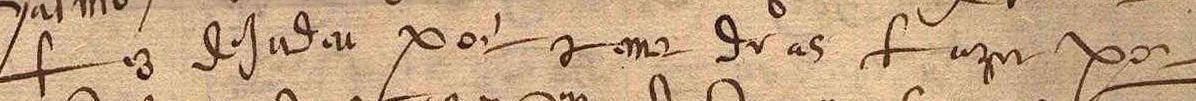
fez de Judeu por temer de as fazer por
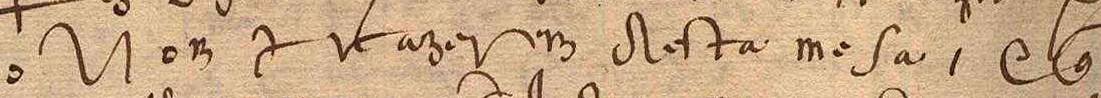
o Nom trazerem A esta mesa / e q̄
